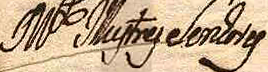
Mto Illustres Senhores.
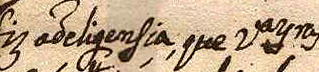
_iz a deligensia, que Vaz sras
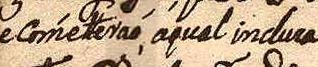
e cómetteraõ, a qual incluza
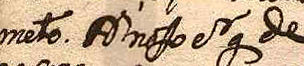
meto, Ao nosso er gde
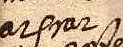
az sraz
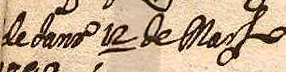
de Ianro 12 de Marso
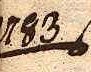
783
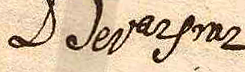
De vaz sraz
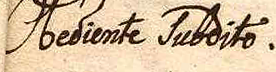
Obediente subdito.
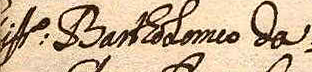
issro: BarthoLomeo da
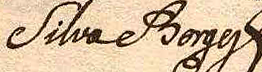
Silva Borges
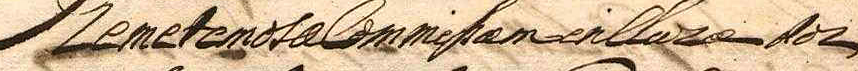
Remetemos a Commissam= inCluza doz
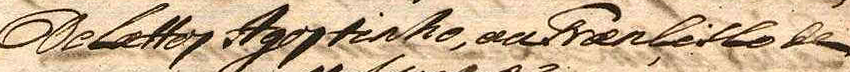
DeLattos Agostinho, ou FranÇisCo de
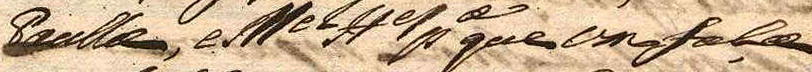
Paulla, e M.el Hes pa que vm faÇa
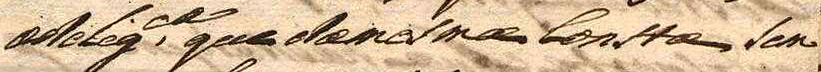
a deLigca, que da mesma Constta sem
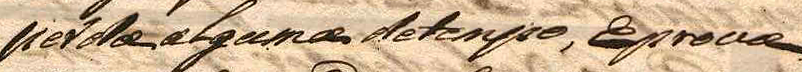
perda alguma de tempo, E prova
